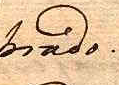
brado.
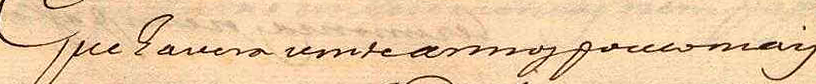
E que havera vinte annos pouco mais
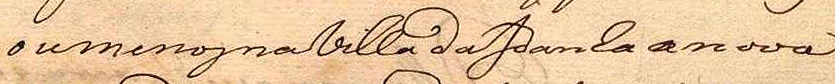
ou menos na Villa da Jdanha a nova
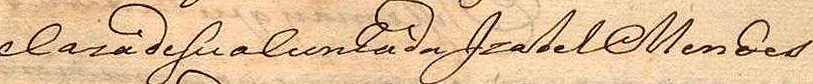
e Caza de sua Cunhada Jzabel Mendes
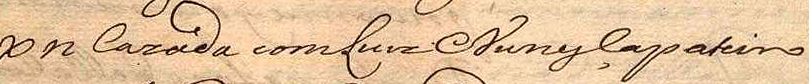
xn Cazada com Luiz Nunes Çapateiro
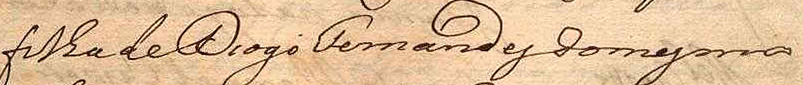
filha de Diogo Fernandes do mesmo
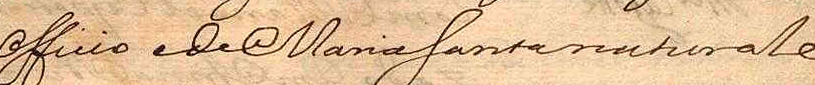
officio e de Maria santa natural e
